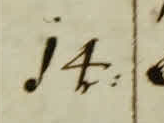14:
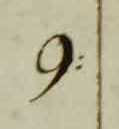9:
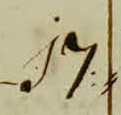17:
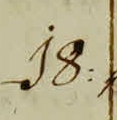18
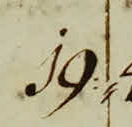19:
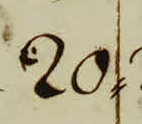20
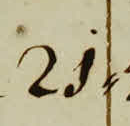21
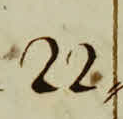22
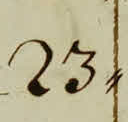23
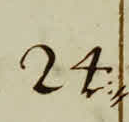24
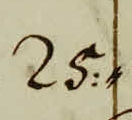25:
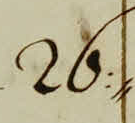26
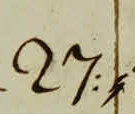27:
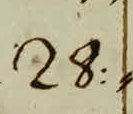28:
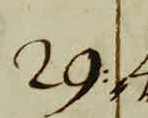29:
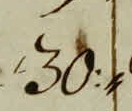30:
